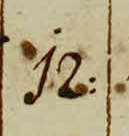12:
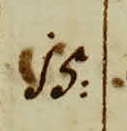15:
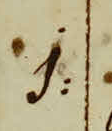1:
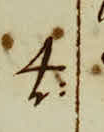4:
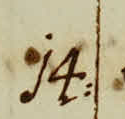14:
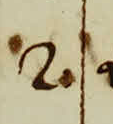2:
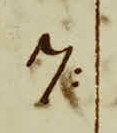7:
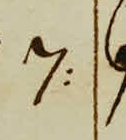7:
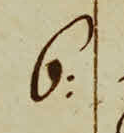6:
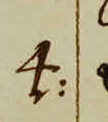4:
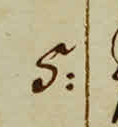5:
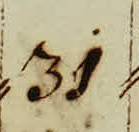31
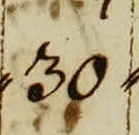30
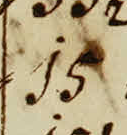15
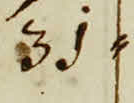31
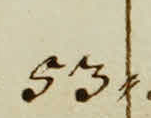53
